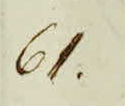61.
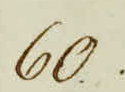60.
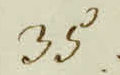35
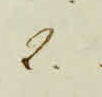2.
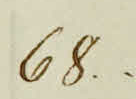68.
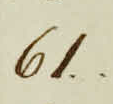61.
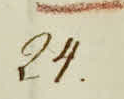24.
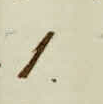1.
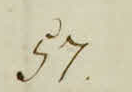57.
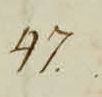47.
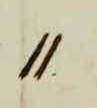11.
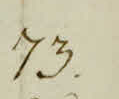73.
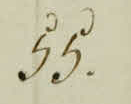55.
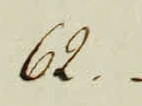62.
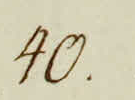40.
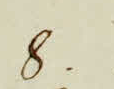8.
